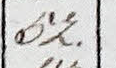52.
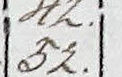52.
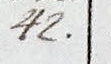42.
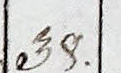38.
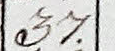37.
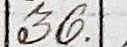36.
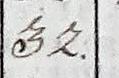32.
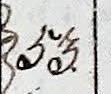53.
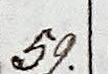59.
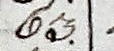63.
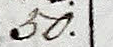50.
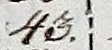43.
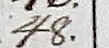48.
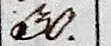30.
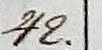42.
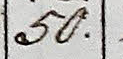50.
